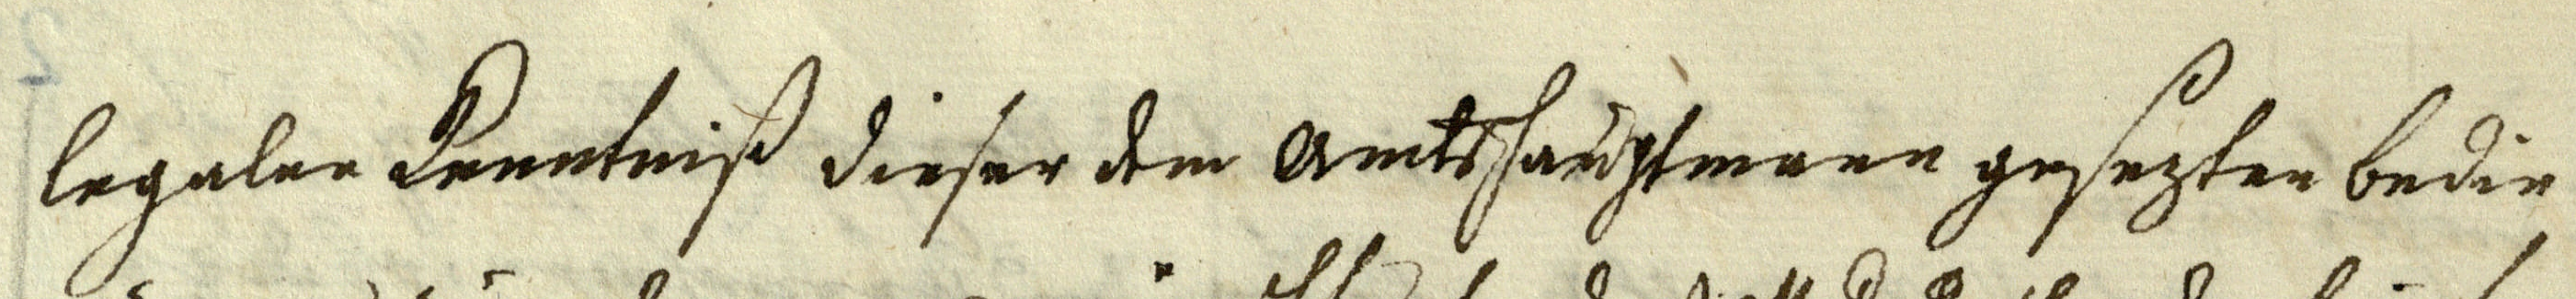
legalen Kenntniß dieser dem Amtshauptmann gesetzten Bedin¬
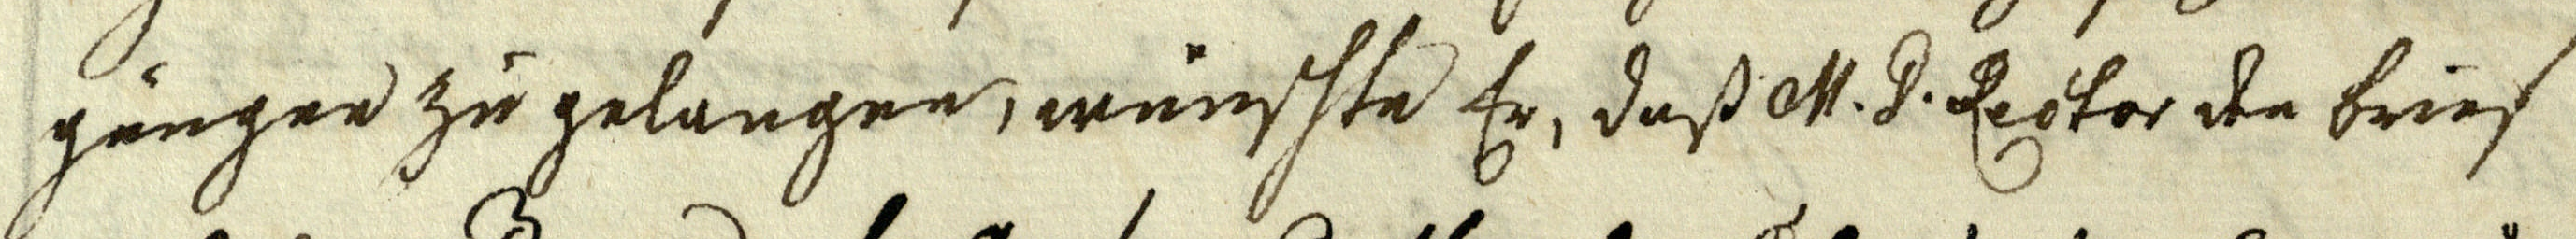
gungen zu gelangen, wünschte Er, daß M. D. Rector die Brief
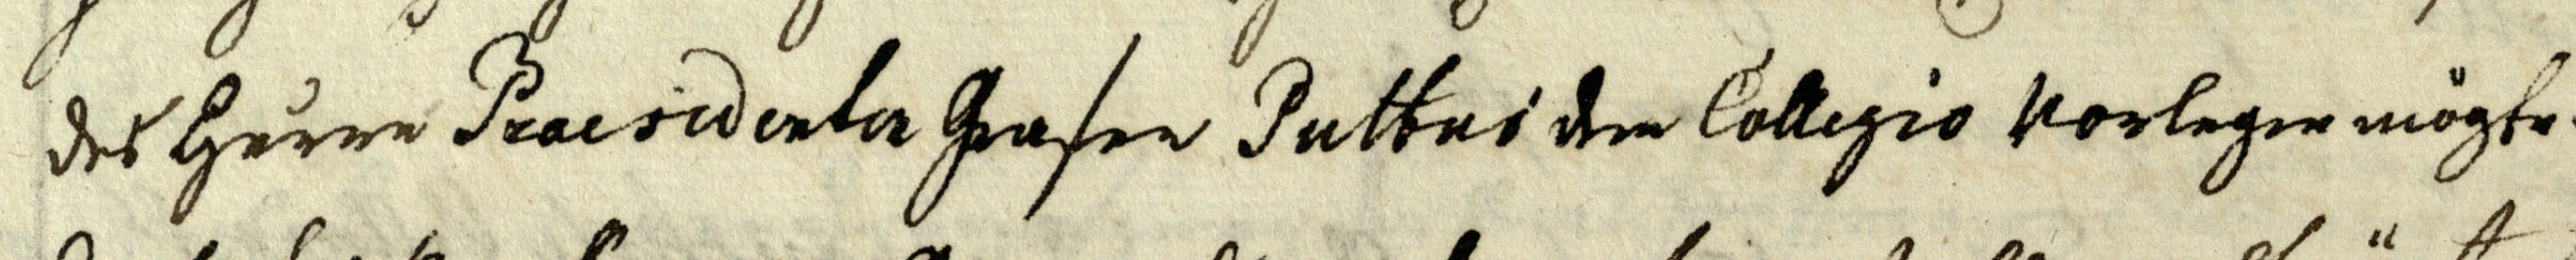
des Herrn Praesidenten Grafen Puttbus dem Collegio vorlegen mögte.
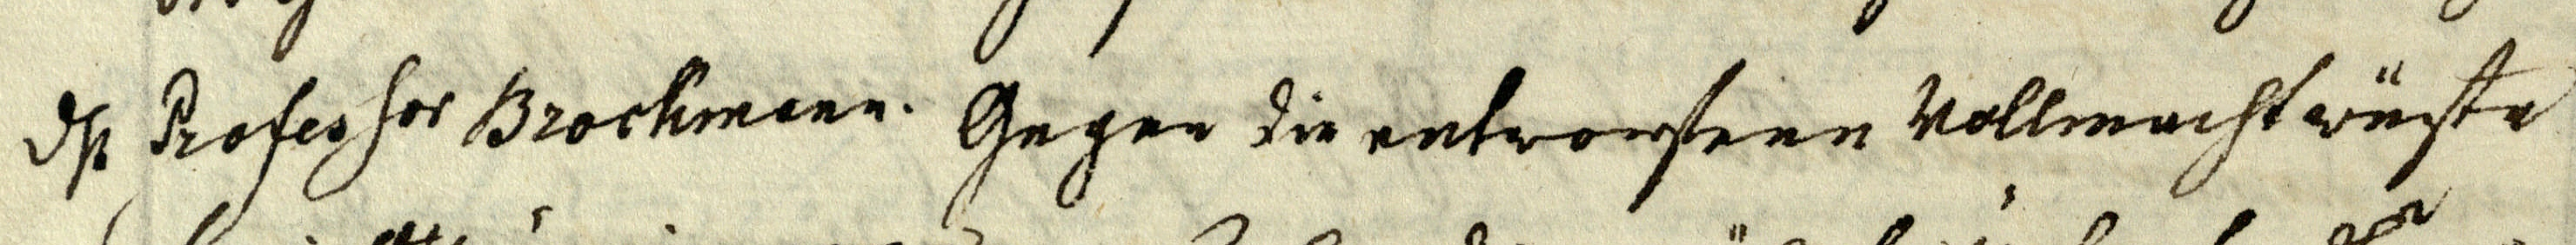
dh. Professor Brockmann. Gegen die entworfene Vollmacht wüßte
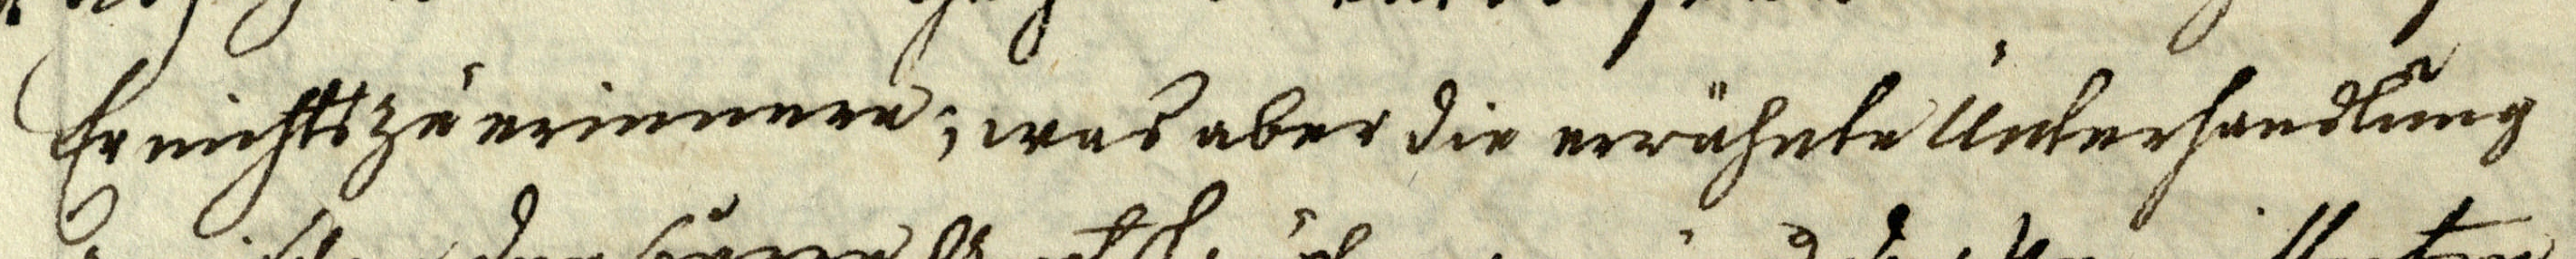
Er nichts zu erinnern; was aber die erwähnte Unterhandlung
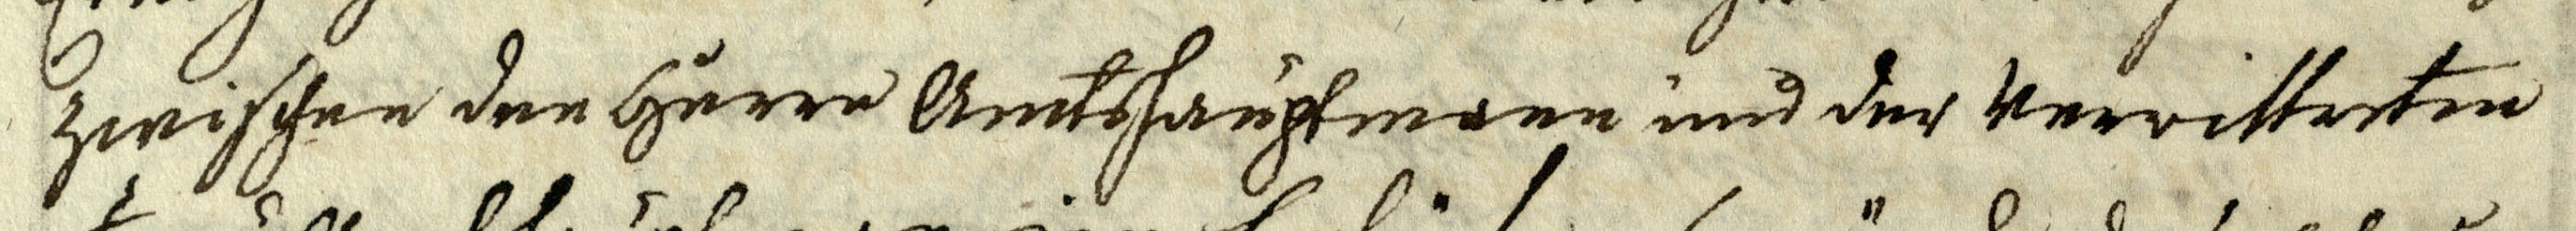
zwischen dem Herrn Amtshauptmann und der verwittweten
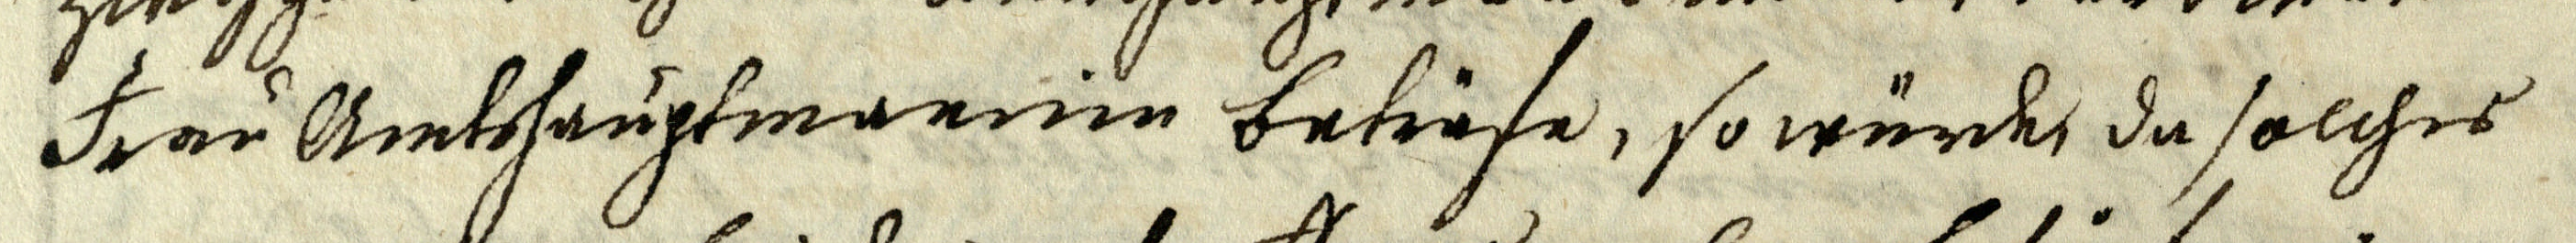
Frau Amtshauptmannin beträfe, so würde, da solches
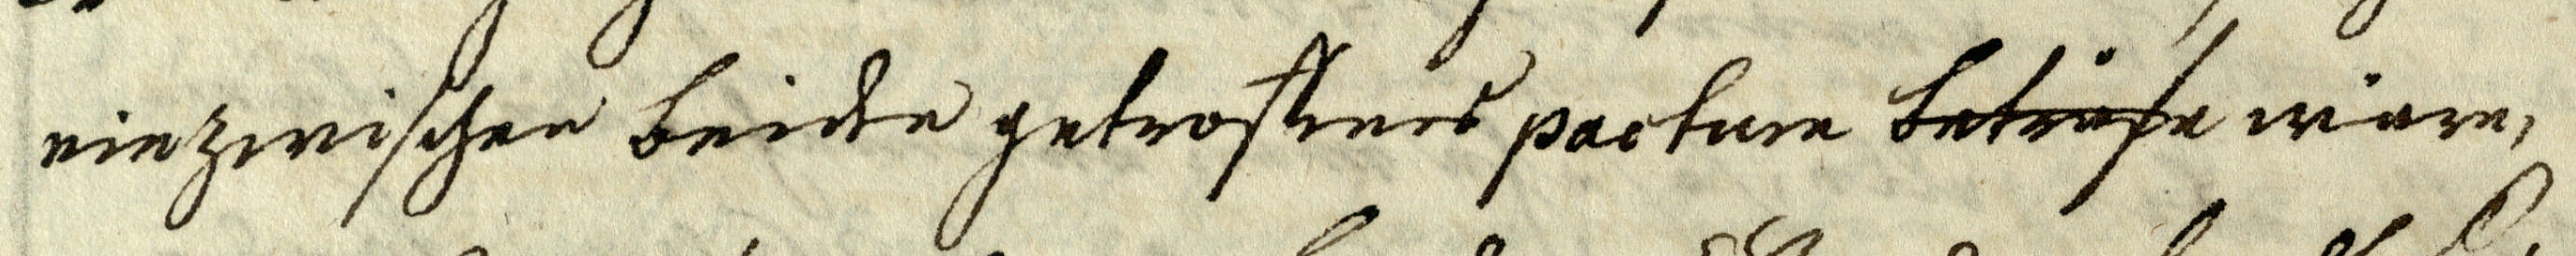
ein zwischen beiden getroffenes pactum beträfe wäre,
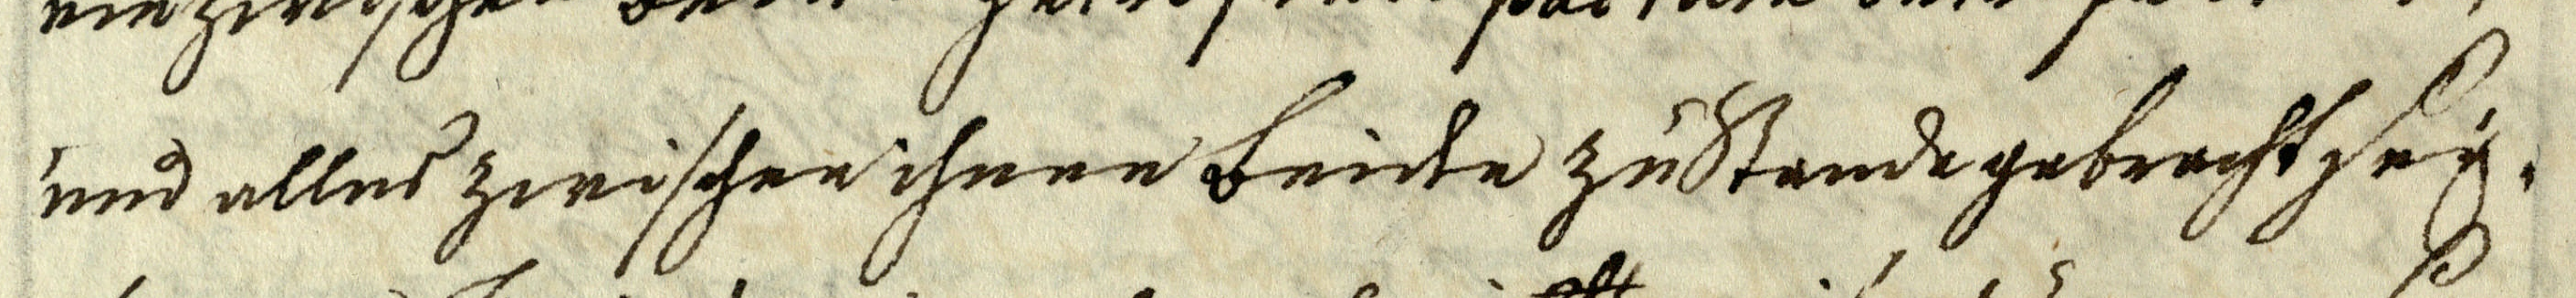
und alles zwischen ihnen Beide zu Stande gebracht seÿ,
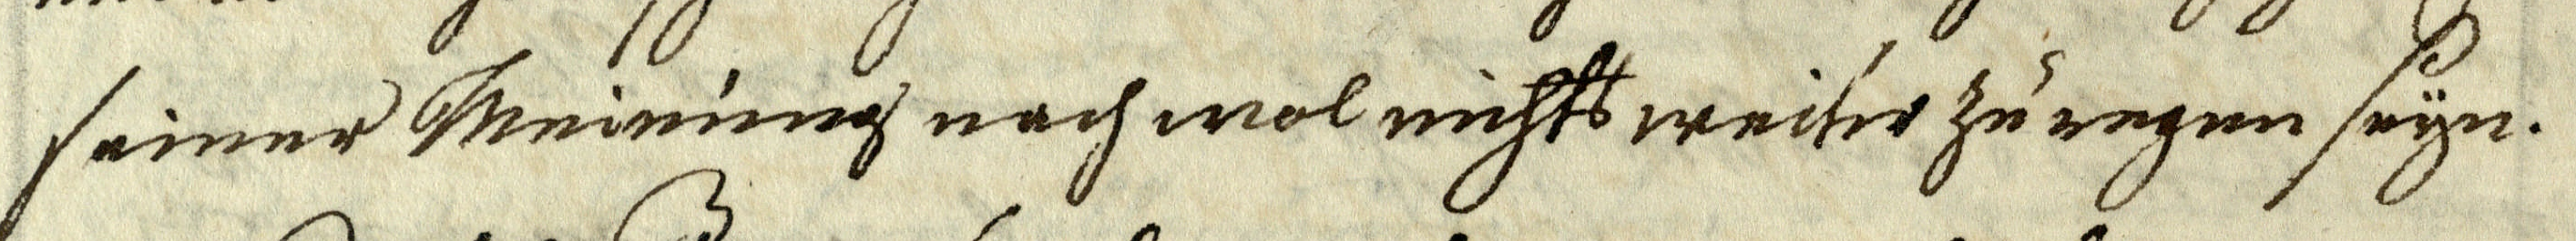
seiner Meinung nach wohl nichts weiter zu regen seÿn.
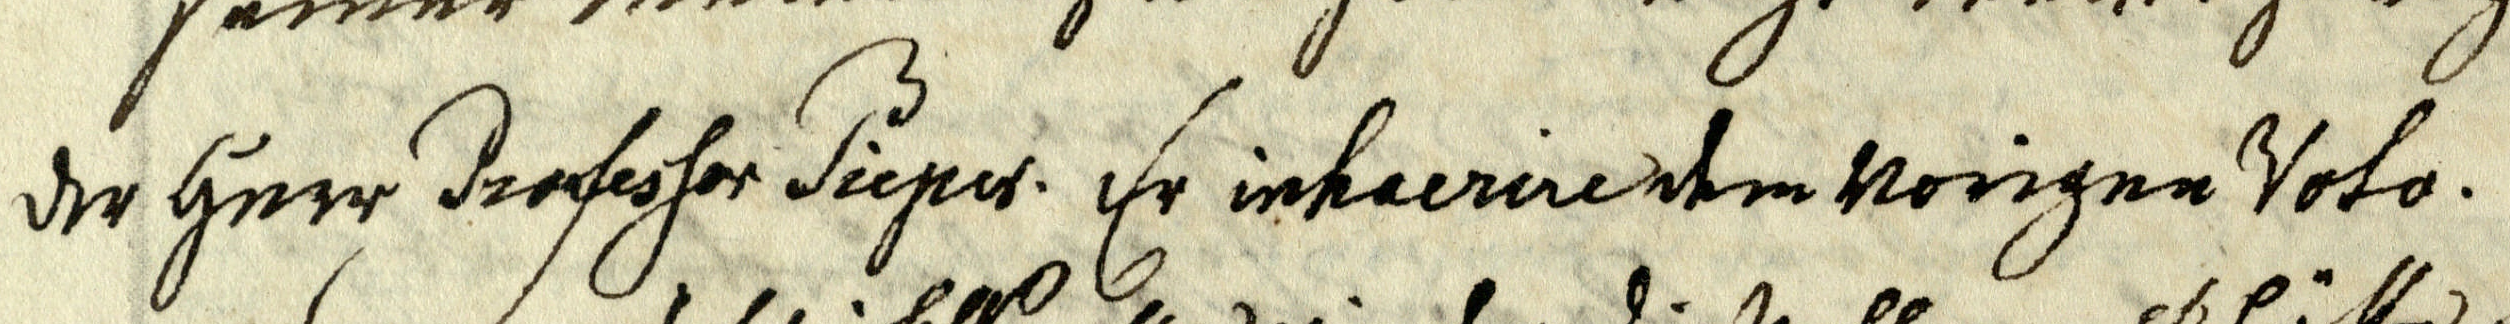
der Herr Professor Piper. Er inhaerire dem vorigen Voto.
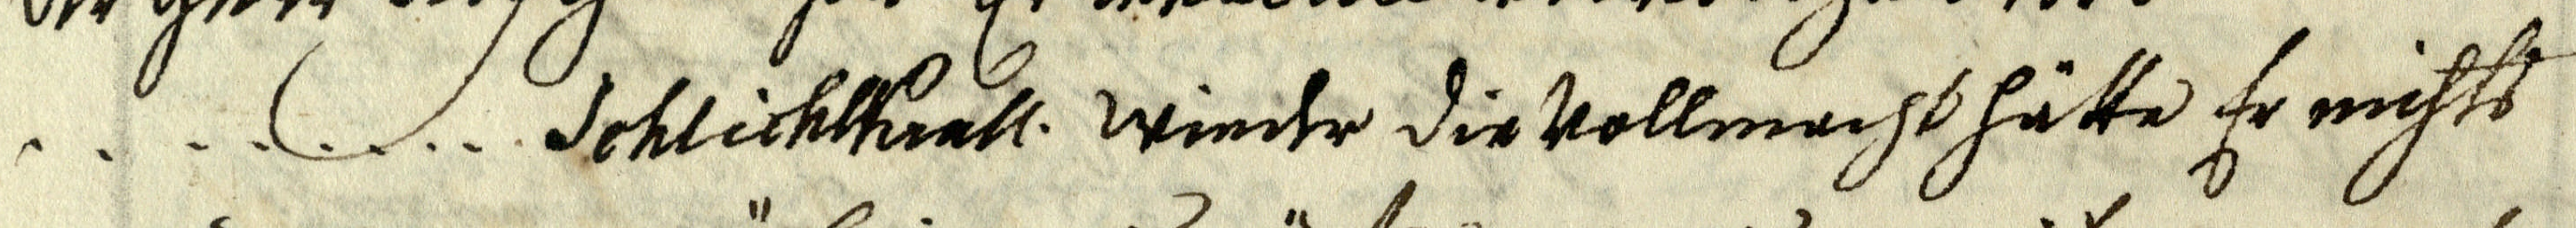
Schlichtkrull. Wieder die Vollmacht hätte Er nichts
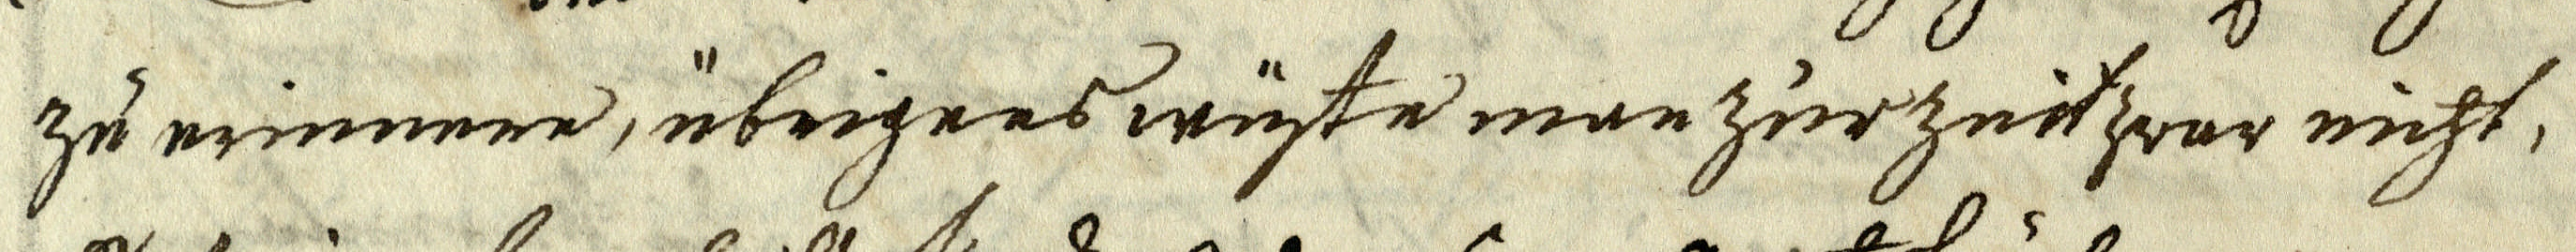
ist erinnern, übrigens wüßte man zurzeit zwar nicht,
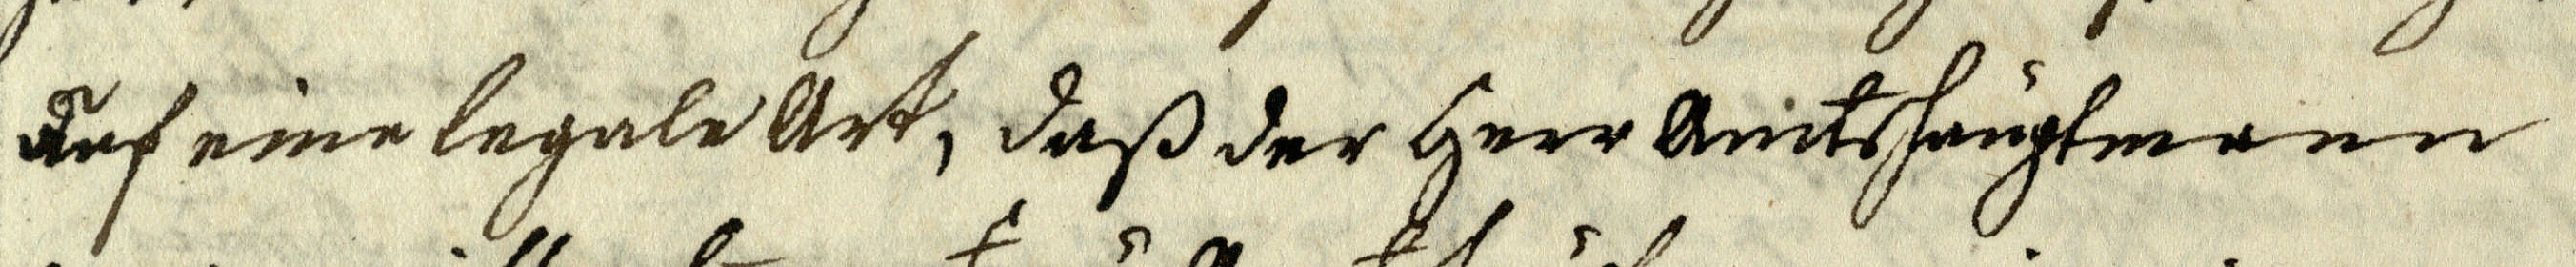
auf eine legale Art, daß der Herr Amtshauptmann
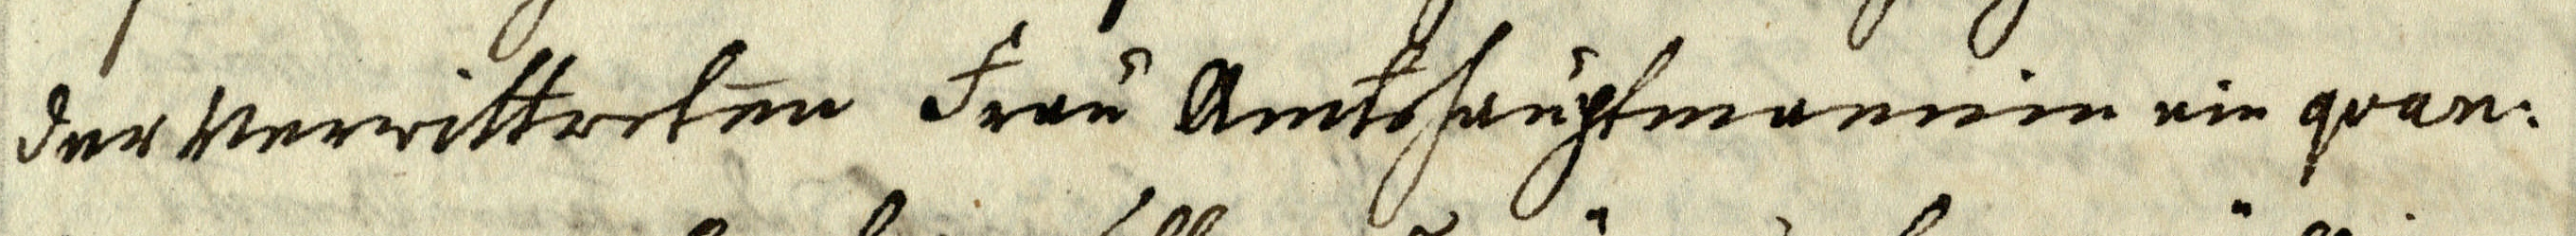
der Verwittweten Frau Amtshauptmannin ein quan¬
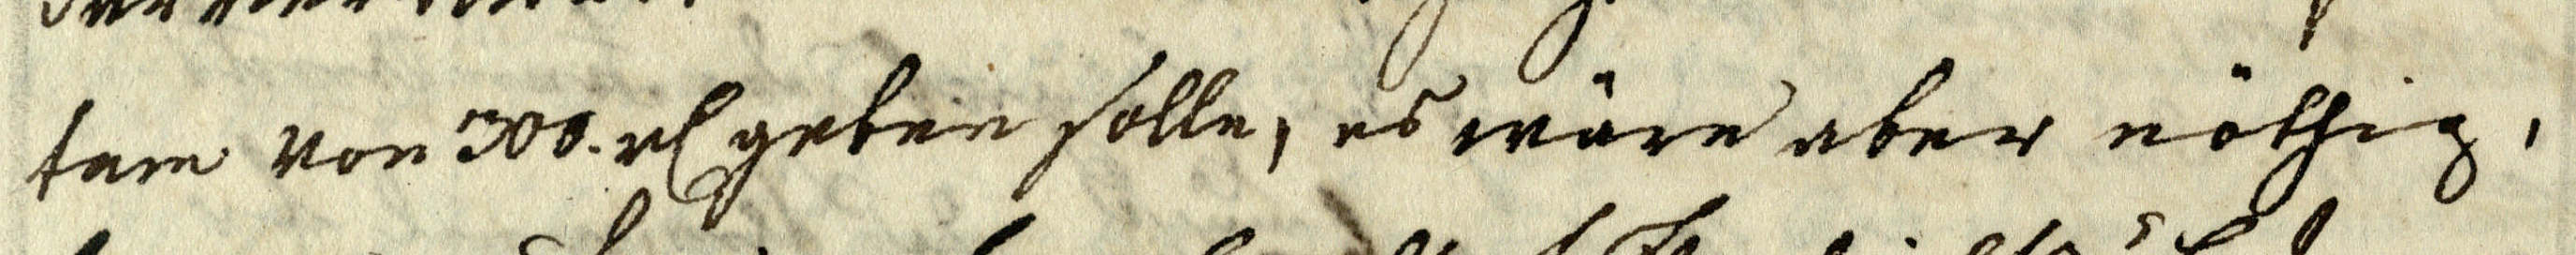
tum von 300. rl geben solle, es wäre aber nöthig,
